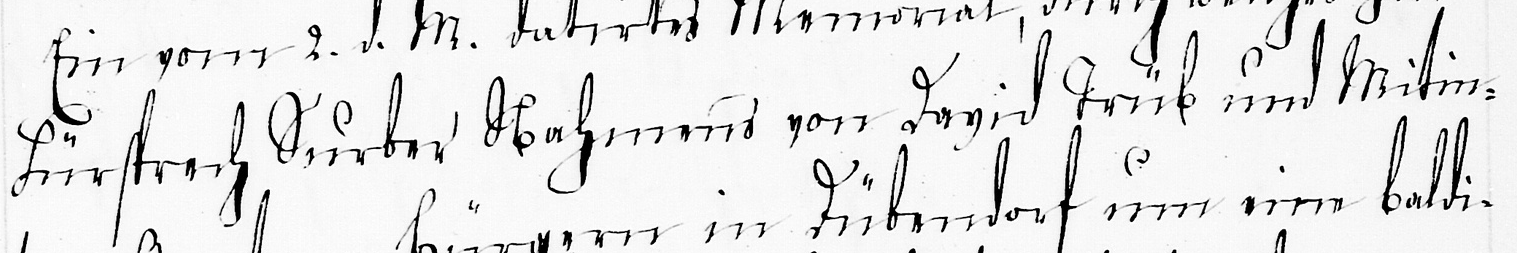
Fürsprech Surber Nahmens von David Trüb und Mitin¬
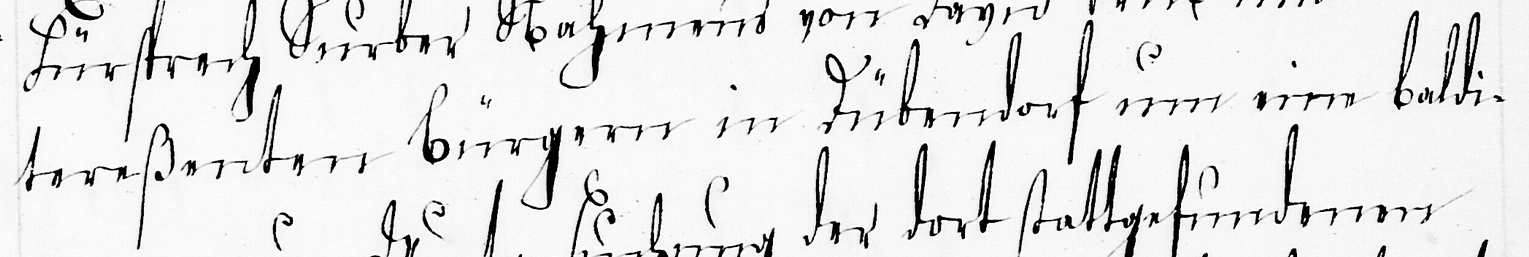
tereßenten Bürgern in Dübendorf um eine baldi¬
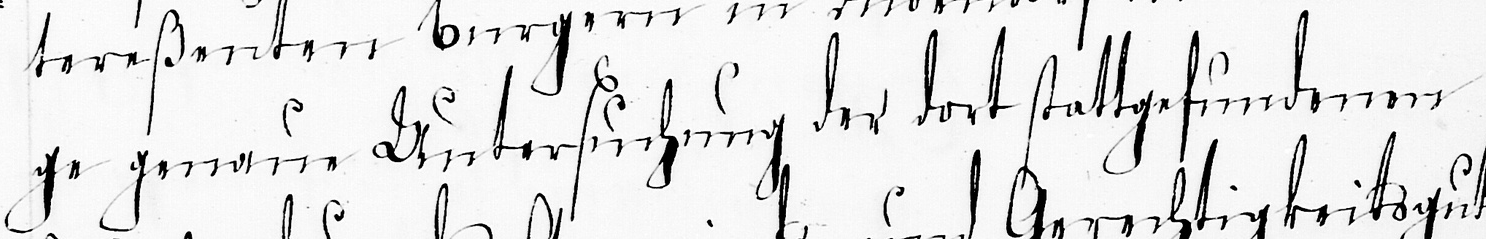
ge genaue Untersuchung der dort stattgefundenen
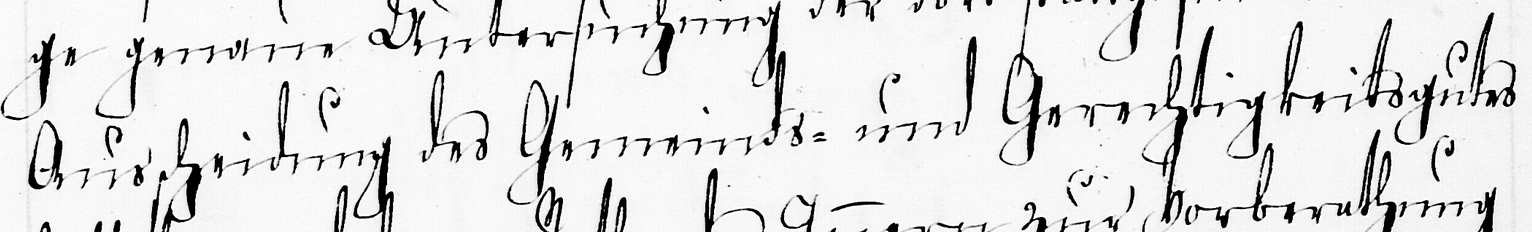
Ausscheidung des Gemeinds- und Gerechtigkeitsgutes
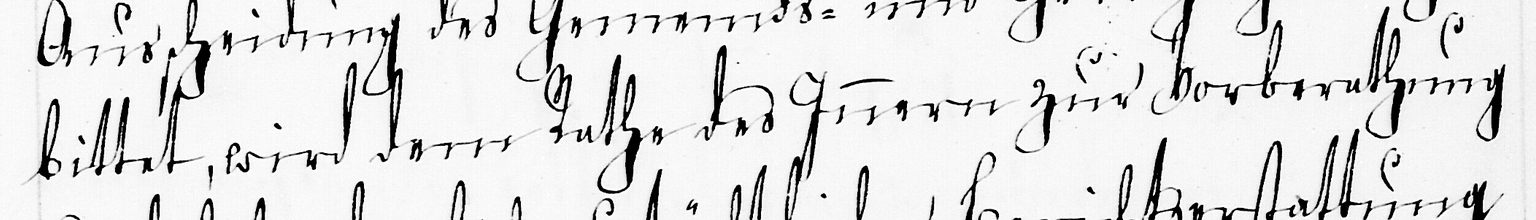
bittet, wird dem Rathe des Innern zur Vorberathung
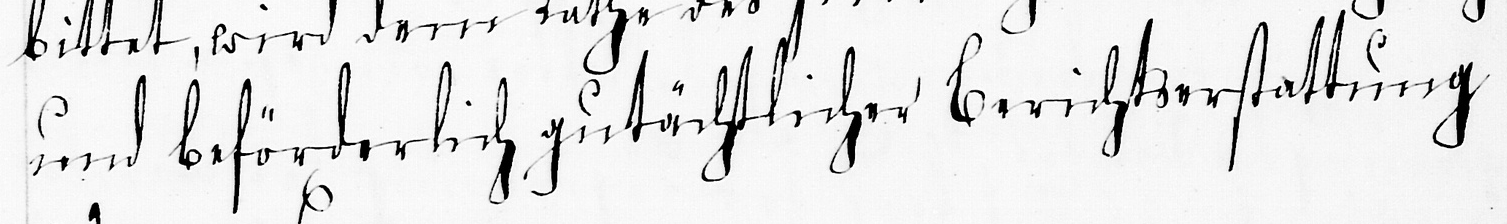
und beförderlich gutächtlicher Berichtserstattung
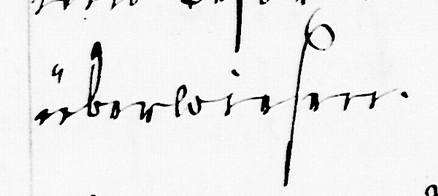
überwiesen.
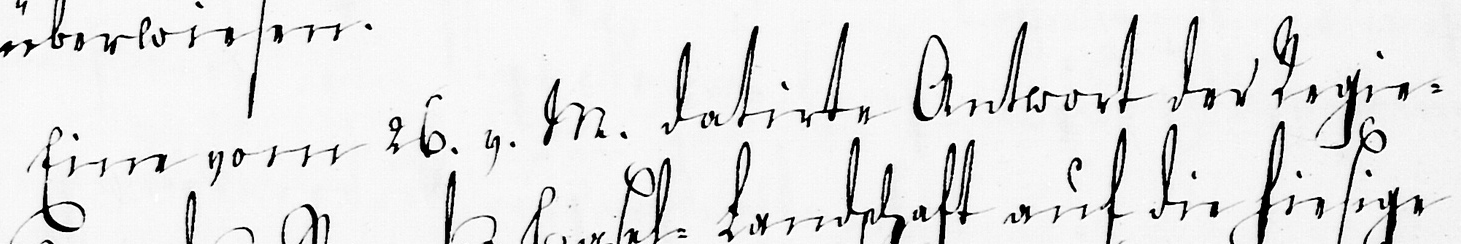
Eine vom 26. v. M. datirte Antwort der Regie¬
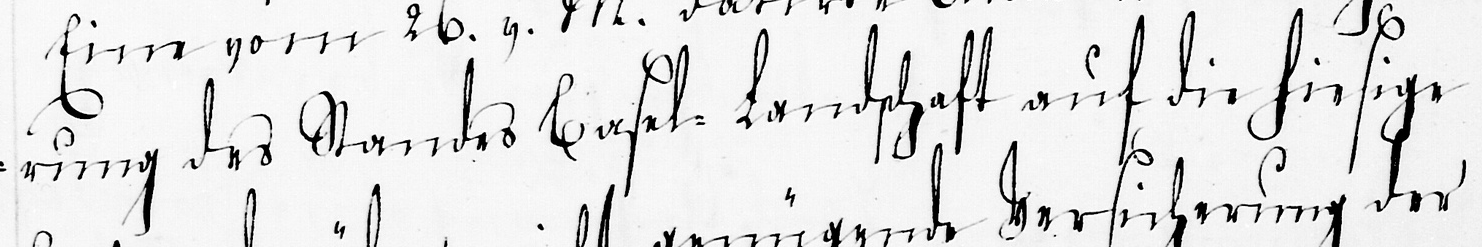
rung des Standes Basel-Landschaft auf die hiesige
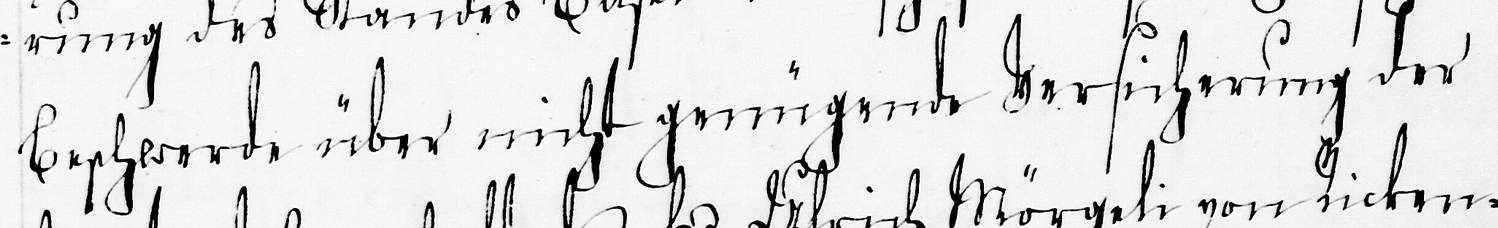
Beschwerde über nicht genügende Versicherung der
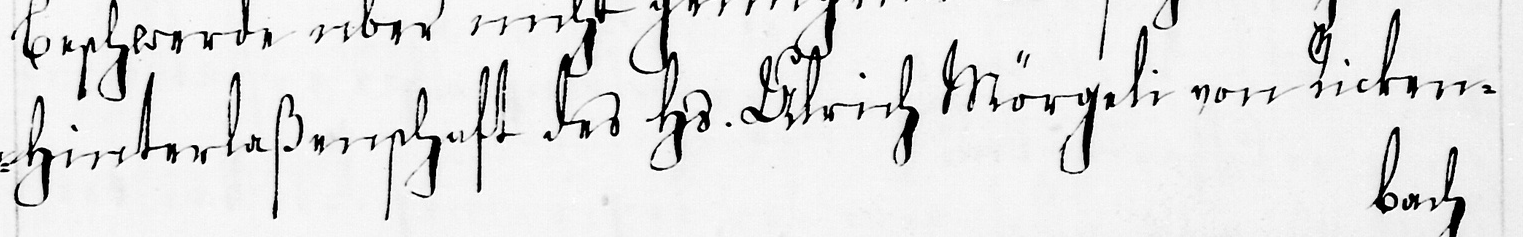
Hinterlaßenschaft des Hs. Ulrich Mörgeli von Ricken-
